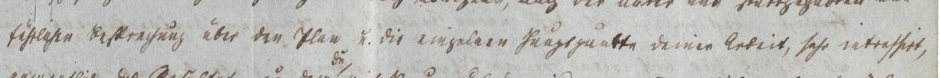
führlichen Besprechung über den Plan u. die einzelnen Hauptpunkte deiner Arbeit, sehr intressirt,
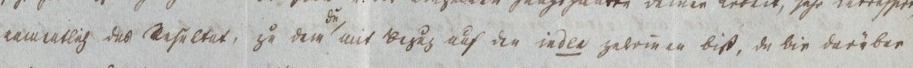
namentlich das Resultat, zu dem du mit Bezug auf den index gekommen bist, da wir darüber
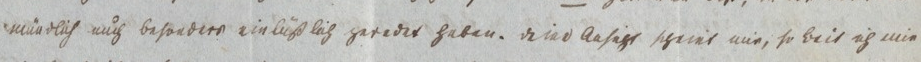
mündlich auch besonders einläßlich geredet haben. Deine Ansicht scheint mir, so weit ich mir
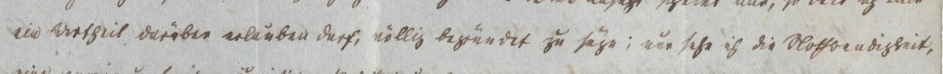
ein Urtheil darüber erlauben darf, völlig begründet zu seyn; nur sehe ich die Nothwendigkeit,
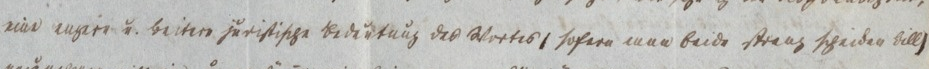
eine engere u. weitere juristische Bedeutung des Wortes (sofern man beide streng scheiden will)
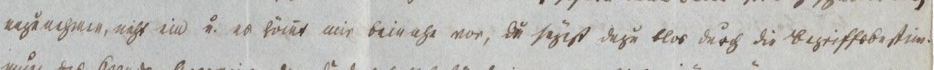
anzunehmen, nicht ein u. es kömmt mir beinahe vor, du seyest dazu blos durch die Begriffsbestimm-
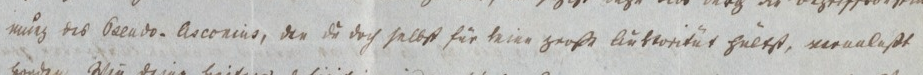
mung des Pseudo-Asconius, den du doch selbst für keine große Auktorität hältst, veranlaßt
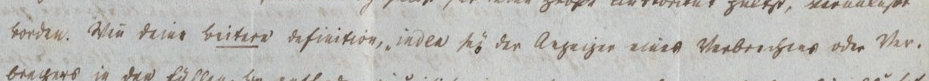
worden. Wenn deine weitere Definition, « index sey der Anzeiger eines Verbrechens oder Ver-
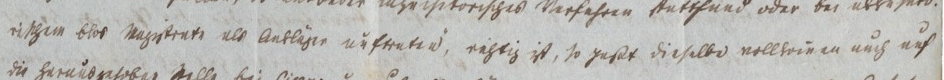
rischem blos Magistrate als Ankläger auftreten», richtig ist, so paßt dieselbe vollkommen auch auf
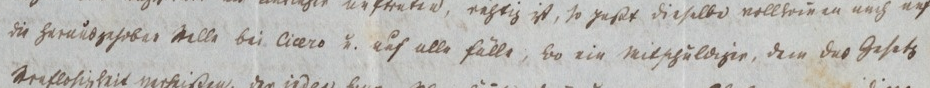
die herausgehobne Stelle bei Cicero u. auf alle Fälle, wo ein Mitschuldiger, dem das Gesetz
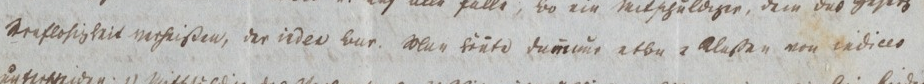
Straflosigkeit verheißen, der index war. Man könnte dann nuretwa 2 Klassen von indices
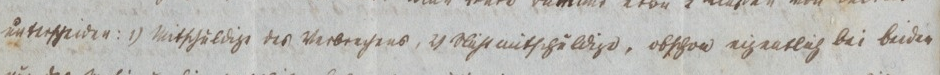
unterscheiden: 1) Mitschuldige des Verbrechens, 2) Nichtmitschuldige, obschon eigentlich bei beiden
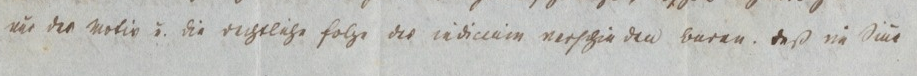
nur das Motiv u. die rechtliche Folge des indicium verschieden waren. Daß im Sinne
